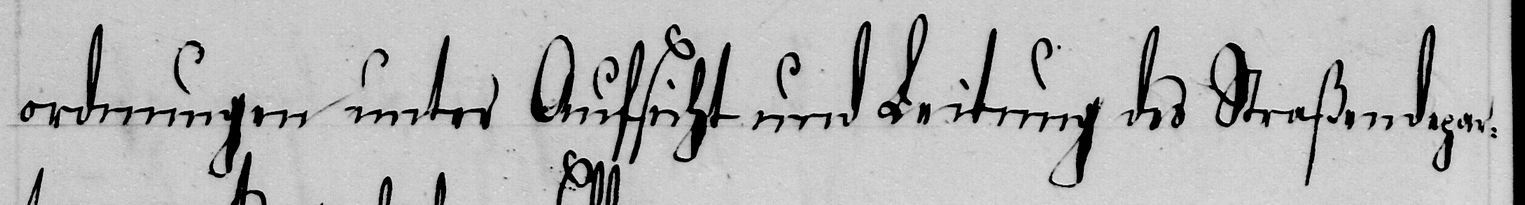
ordnungen unter Aufsicht und Leitung des Straßendepa¬
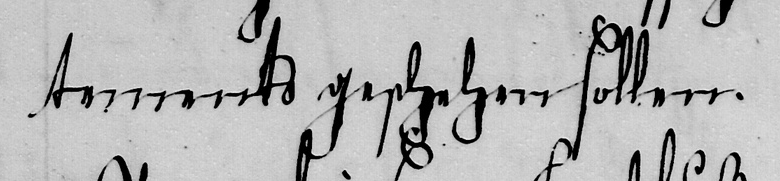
rtements geschehen sollen.
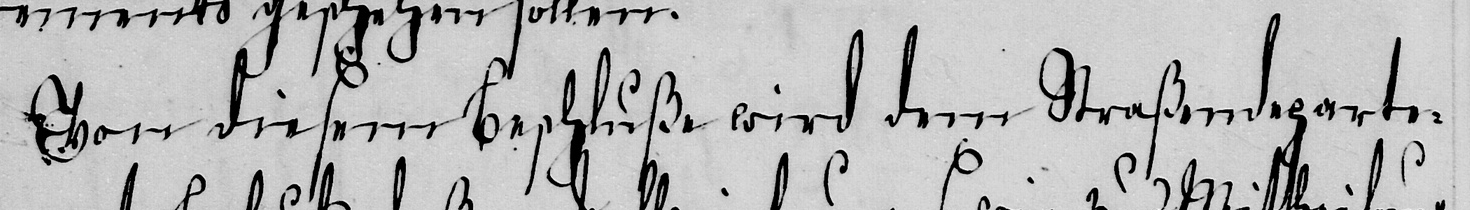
Von diesem Beschluße wird dem Straßendeparte¬
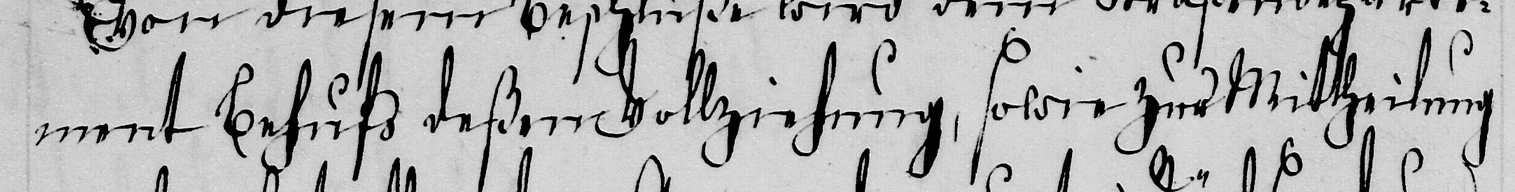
ment Behufs deßen Vollziehung, sowie zur Mittheilung
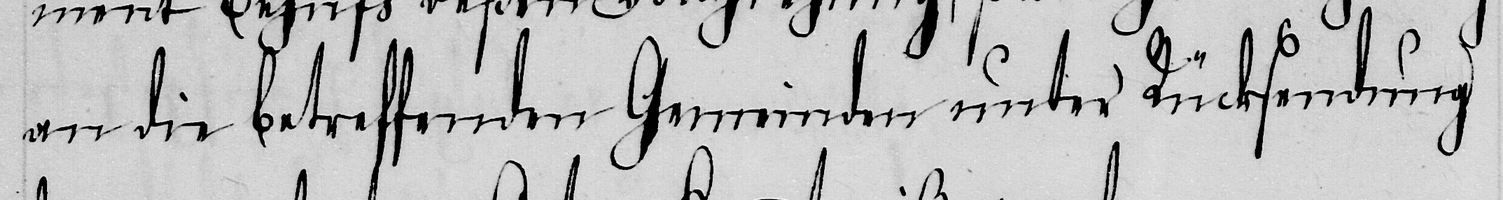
an die betreffenden Gemeinden unter Rücksendung
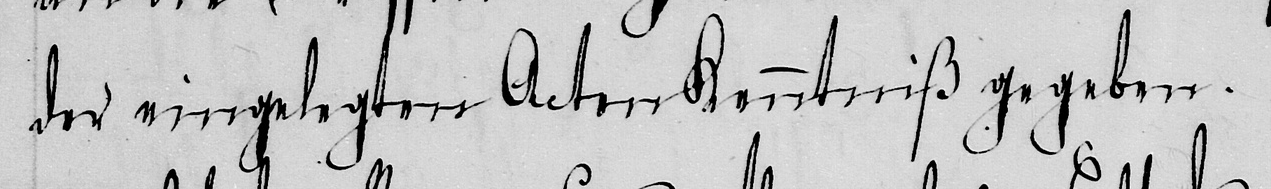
der eingelegten Acten Kenntniß gegeben.
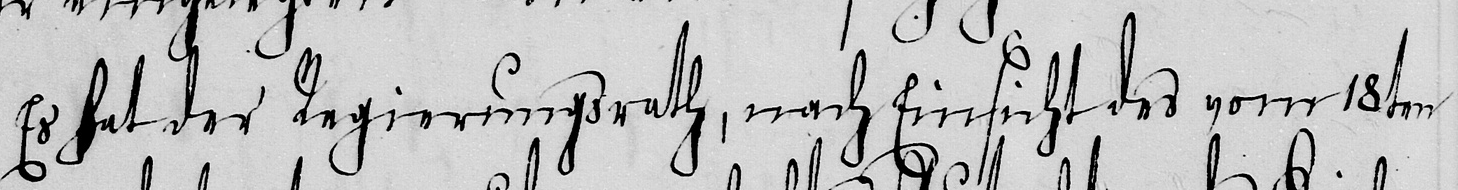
Es hat der Regierungsrath, nach Einsicht des vom 18ten
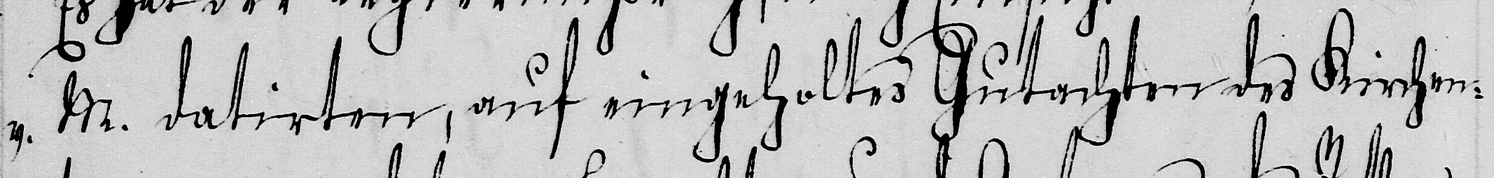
M. datirten, auf eingeholtes Gutachten des Kirchen¬
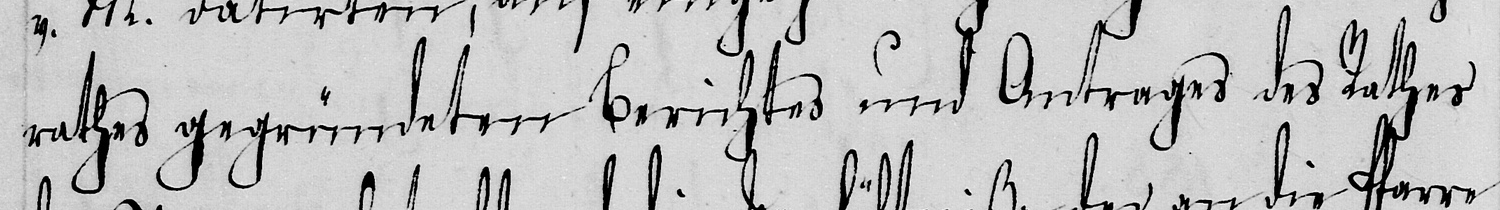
rathes gegründeten Berichtes und Antrages des Rathes
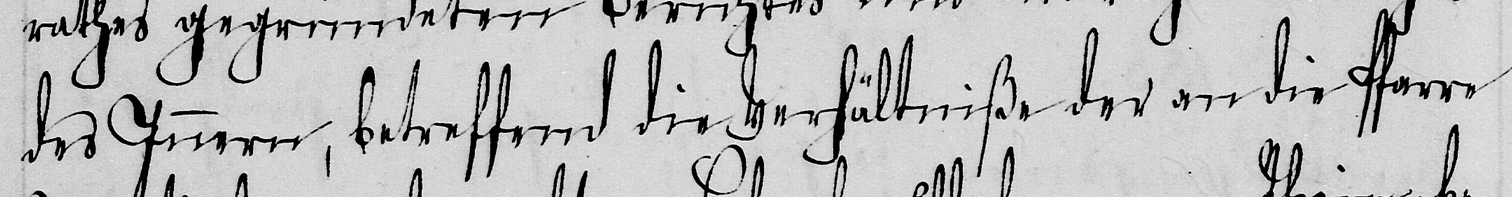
des Innern, betreffend die Verhältniße der an die Pfarre
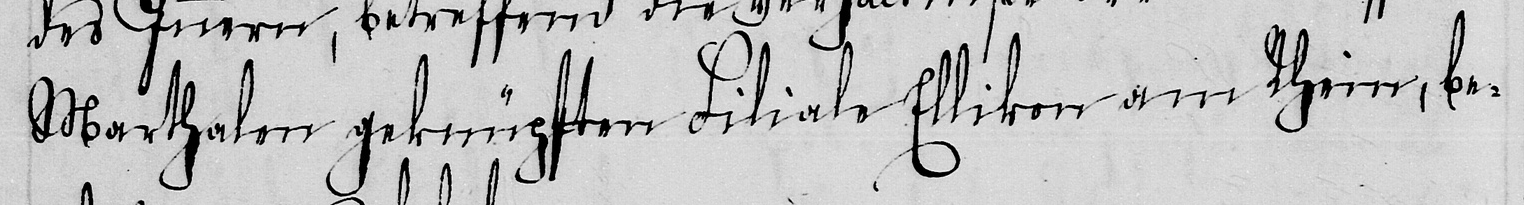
Marthalen geknüpften Filiale Ellikon am Rhein, be¬
